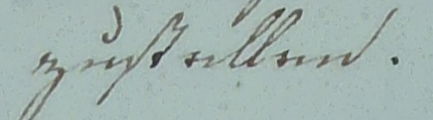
zustellen.
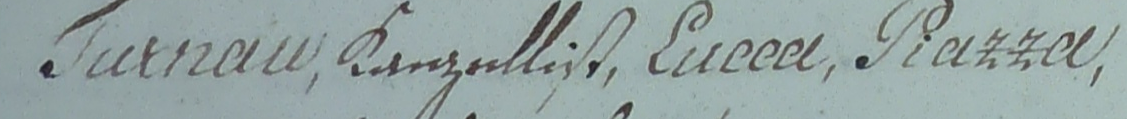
Turnau, Kanzellist, Lucca, Piazza,
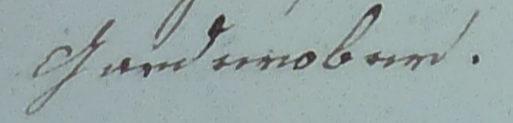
Garderober.
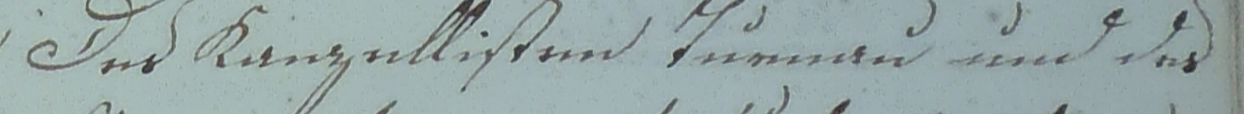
Des Kanzellisten Turnau und des
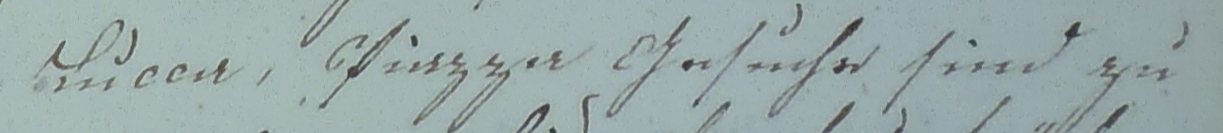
Lucca, Piazza Gesuche sind zu
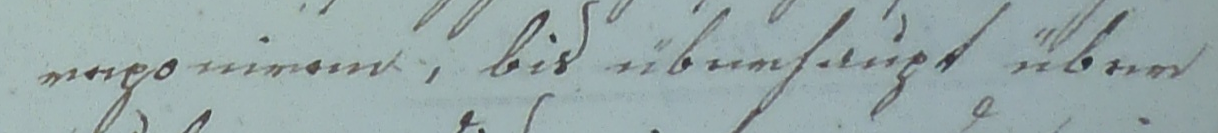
reponiren, bis überhaupt über
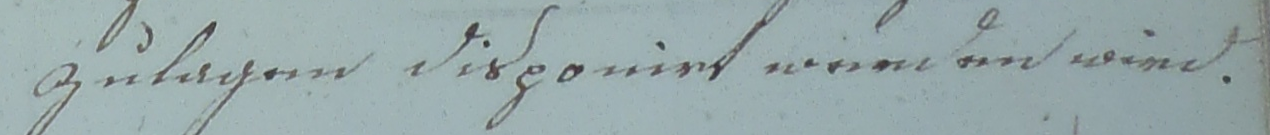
Zulagen disponirt werden wird.
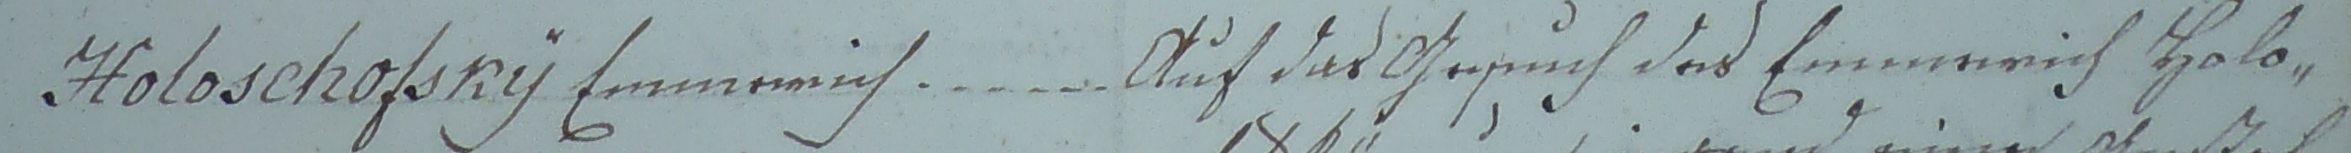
Holoschofsky Emmerich …… Auf das Gesuch des Emmerich Holo¬
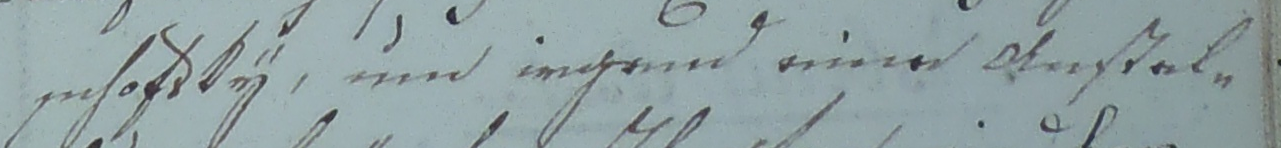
schofsky, um irgend eine Anstel¬
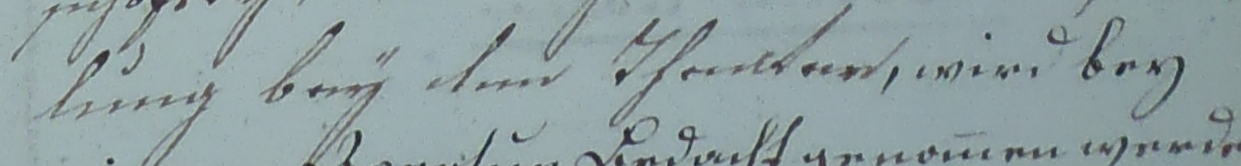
lung bey dem Theater, wird bey
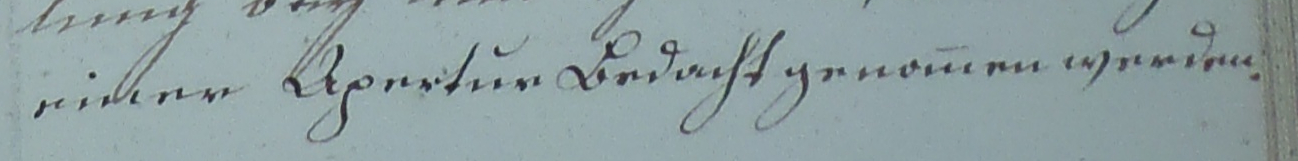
einer Apertur Bedacht genom̅en werden.
